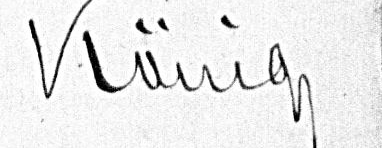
König
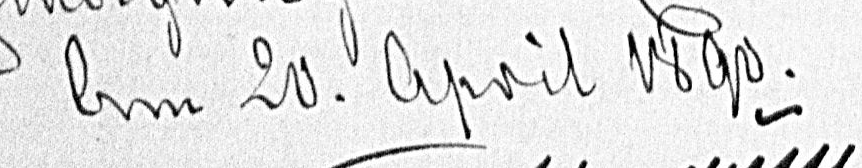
Am 20. April 1890
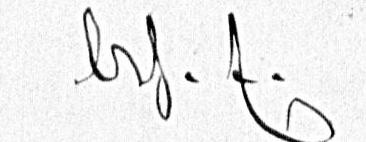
Ah. E.
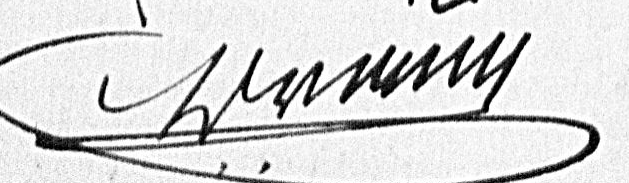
xx
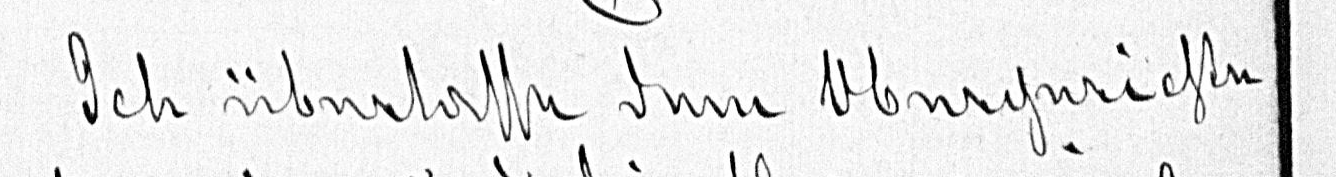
Ich überlasse dem Obergerichte
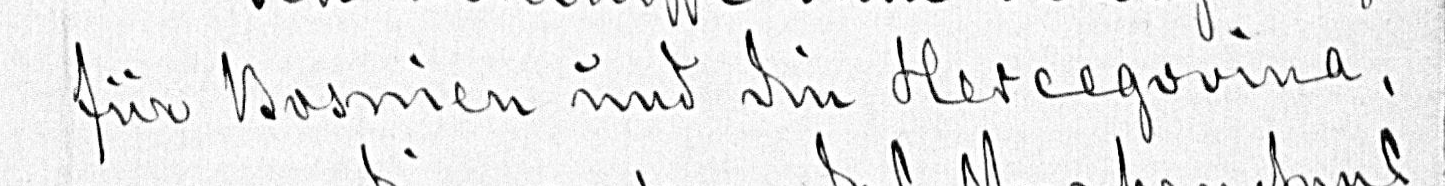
für Bosnien und die Hercegovina,
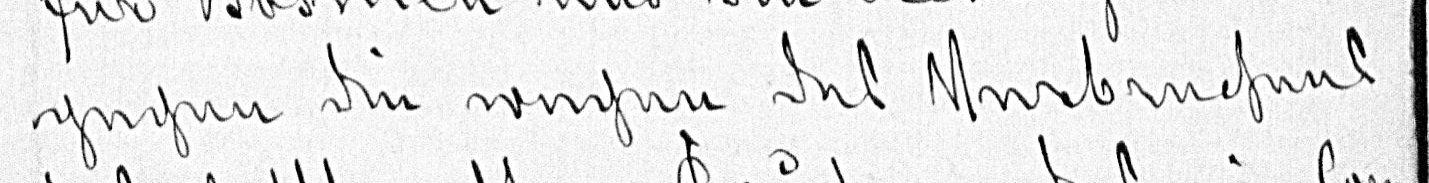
gegen die wegen des Verbrechens
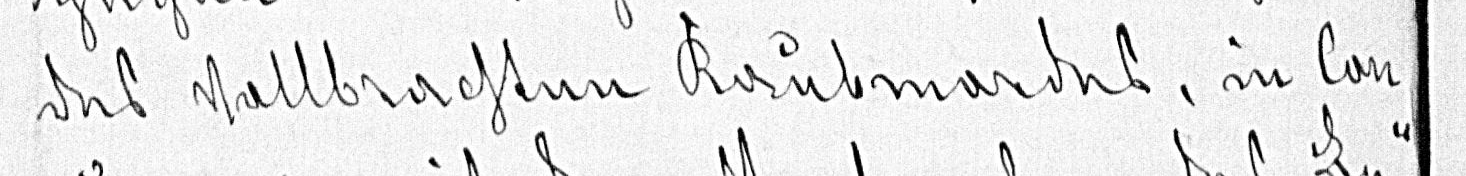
des vollbrachten Raubmordes, in Con¬
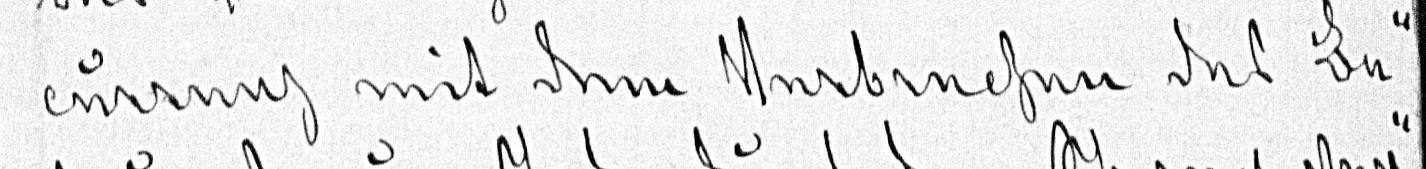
currenz mit dem Verbrechen des Be¬
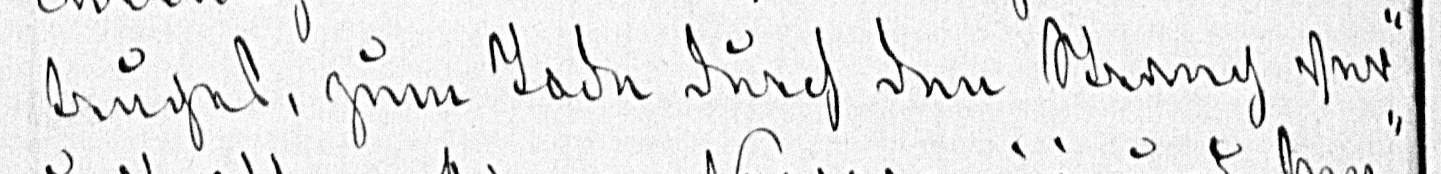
truges, zum Tode durch den Strang ver¬
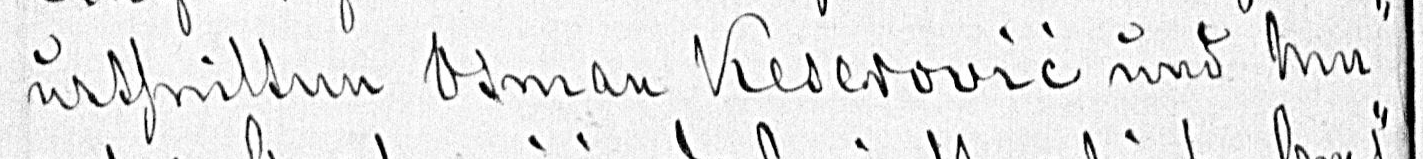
urtheilten Osman Keserović und Mu¬
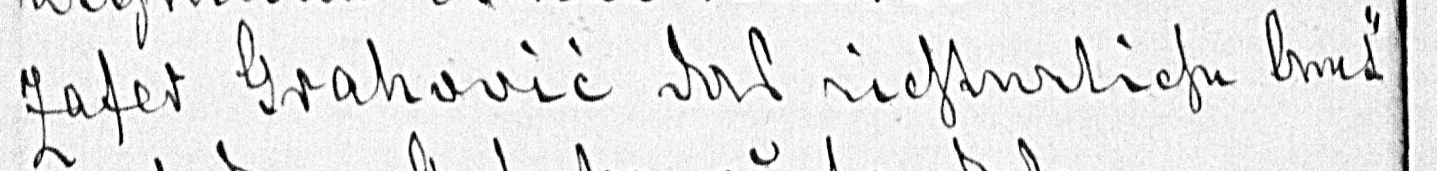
zafer Grahović das richterliche Amt
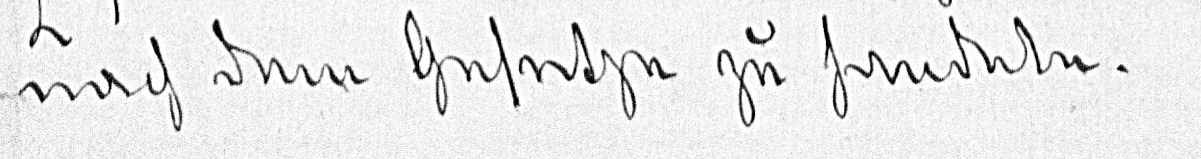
nach dem Gesetze zu handeln.
